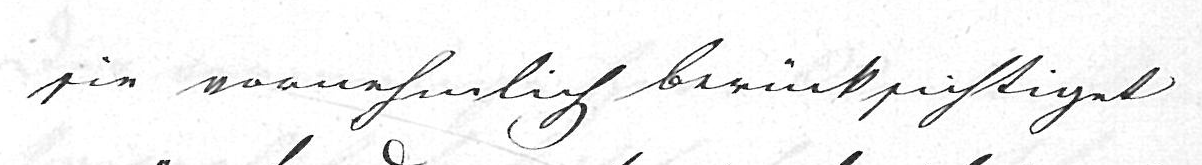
sie vornehmlich berücksichtiget
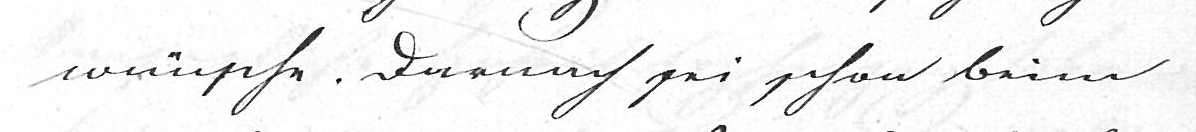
wünsche. Darnach sei schon beim
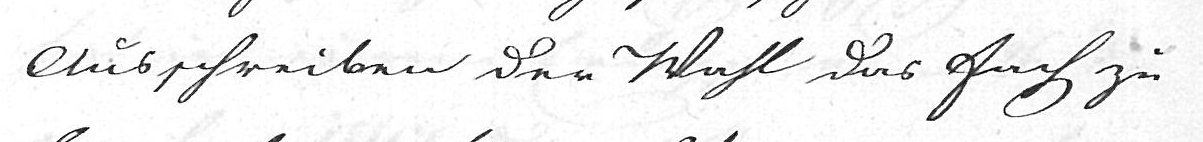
Ausschreiben der Wahl das Fach zu
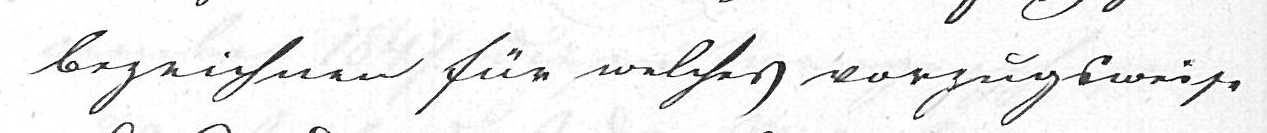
bezeichnen für welches vorzugsweise
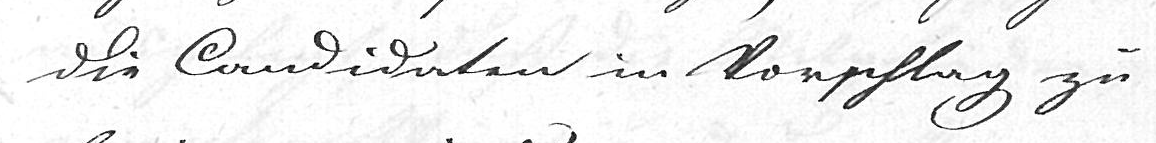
die Candidaten in Vorschlag zu
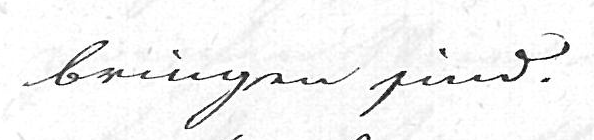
bringen sind.
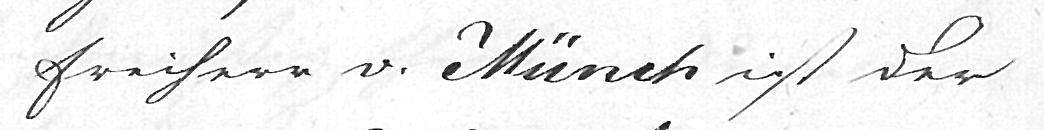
Freiherr v. Münch ist der
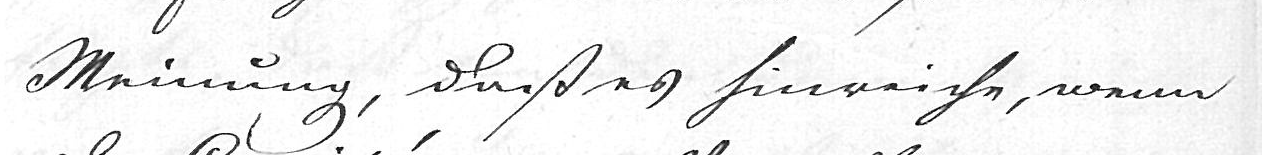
Meinung, daß es hinreiche, wenn
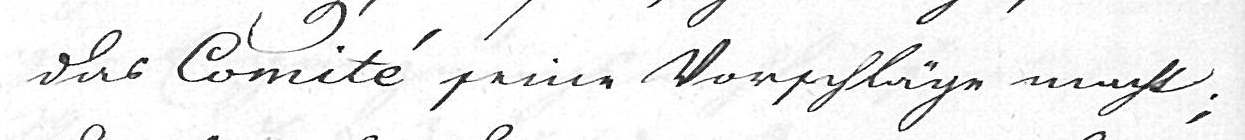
des Comité seine Vorschläge macht;
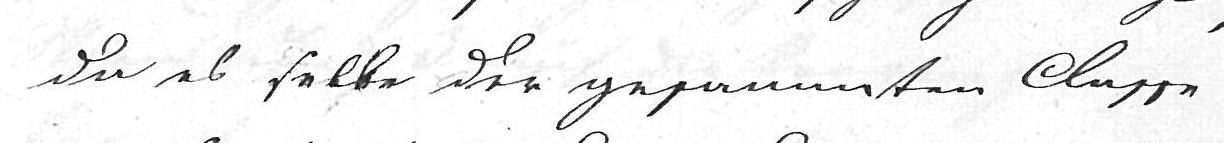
da es selbe der gesammten Classe
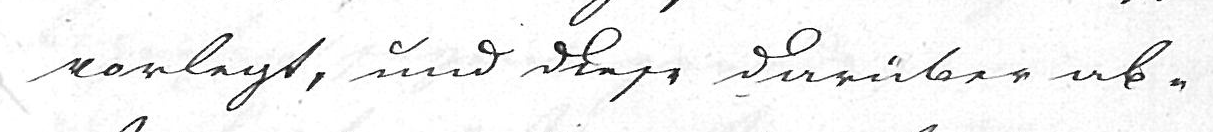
vorlegt, und diese darüber ab-
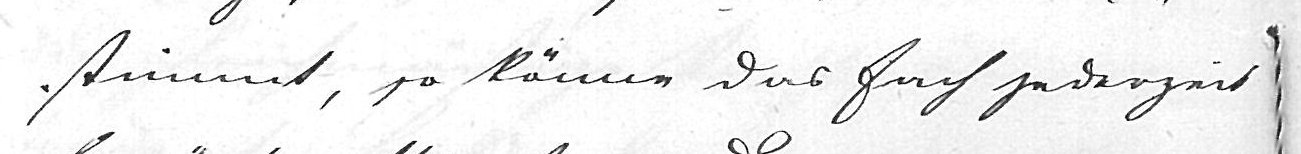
stimmt, so könne das Fach jederzeit
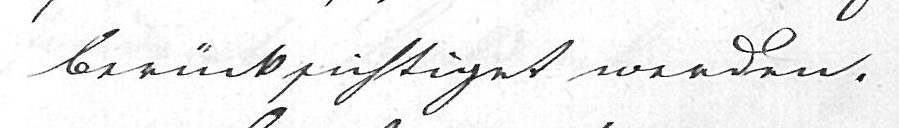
berücksichtiget werden.
